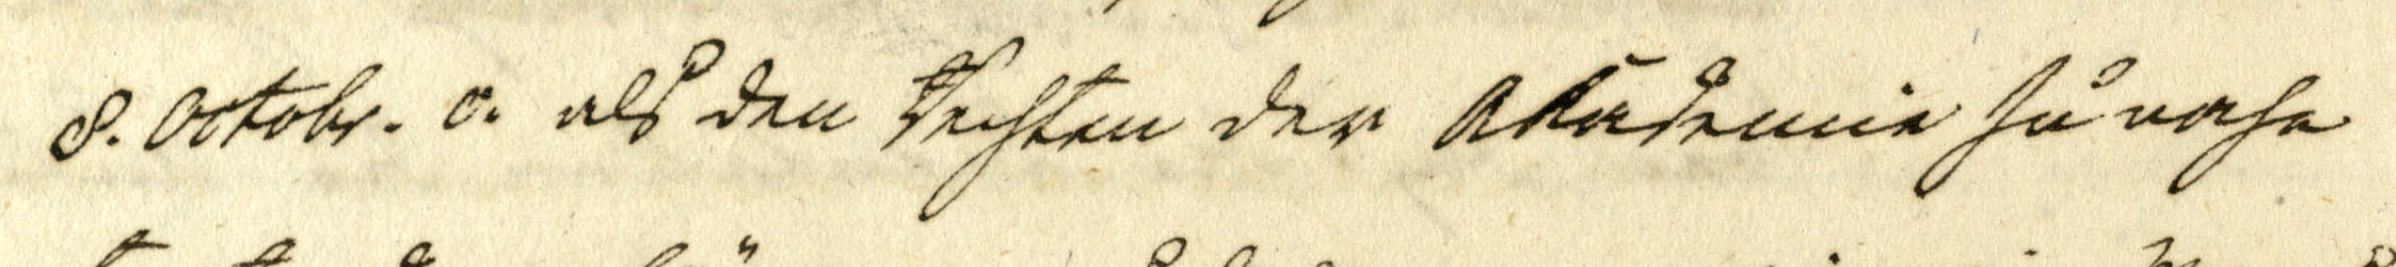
8. Octobr. c. als den Rechten der Akademie zu nahe¬
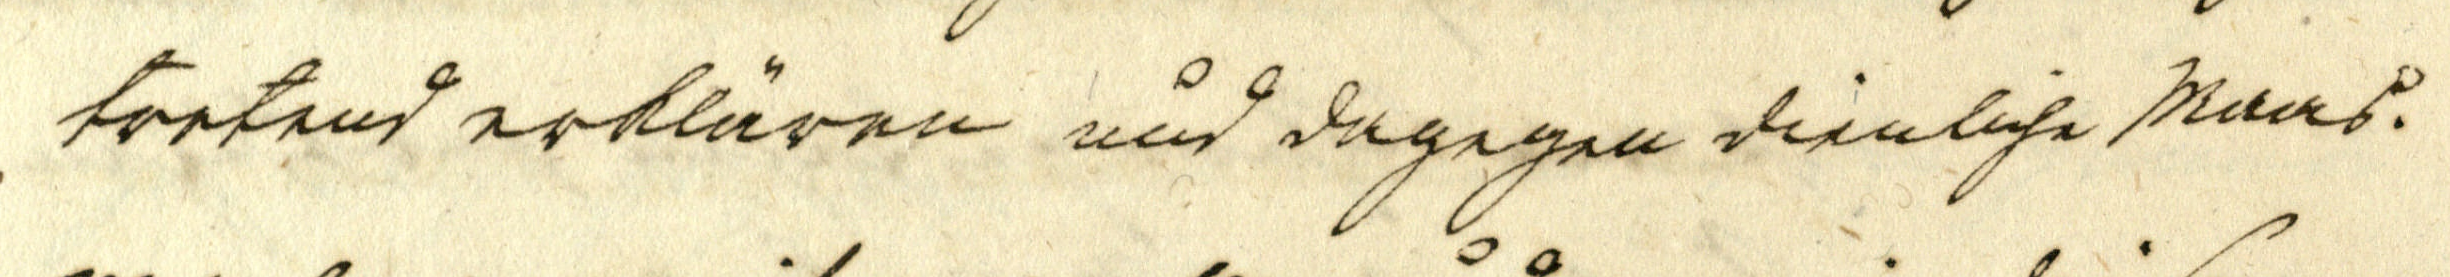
tretend erklären und dagegen dienliche Maas¬
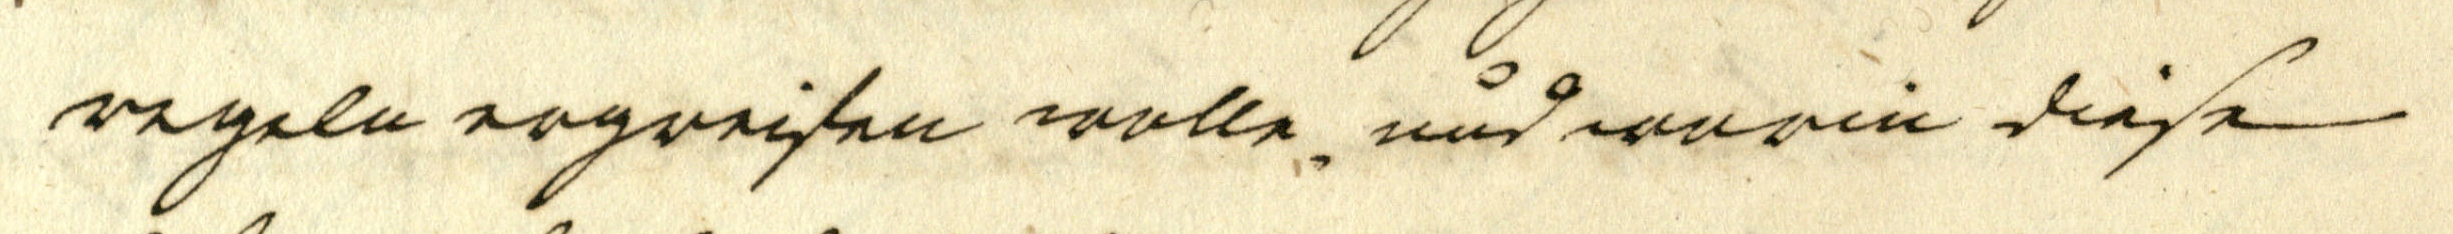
regeln ergreifen wolle, und worin diese
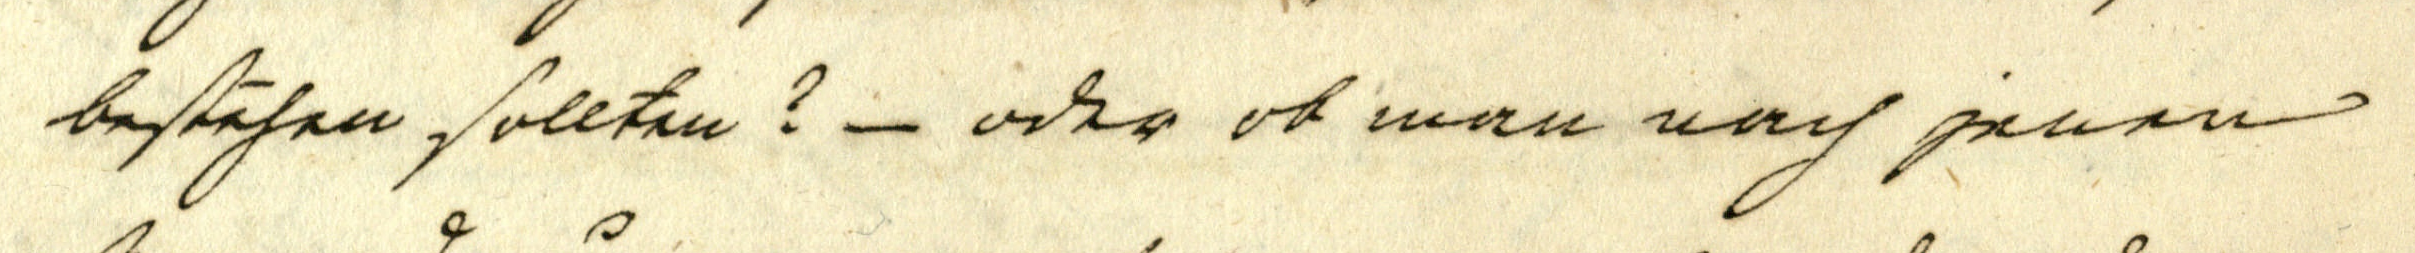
bestehen sollten? oder ob man nach jenen
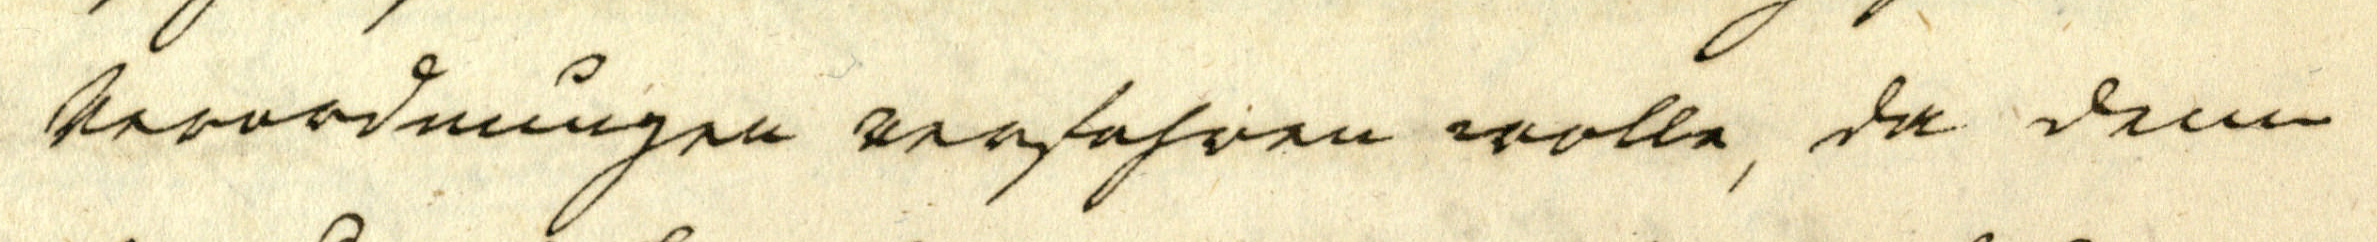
Verordnungen verfahren wolle, da denn
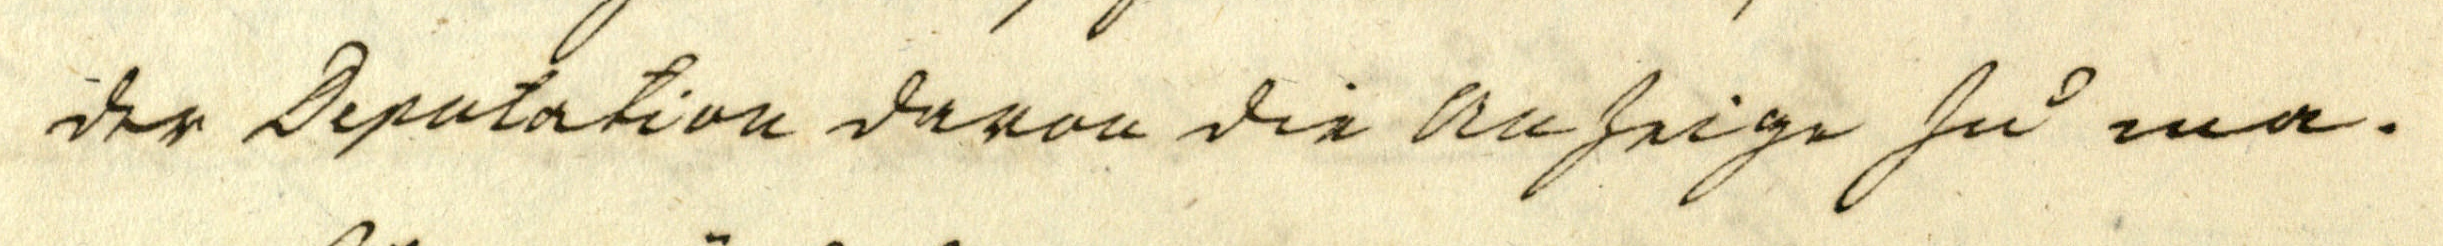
der Deputation davon die Anzeige zu ma¬
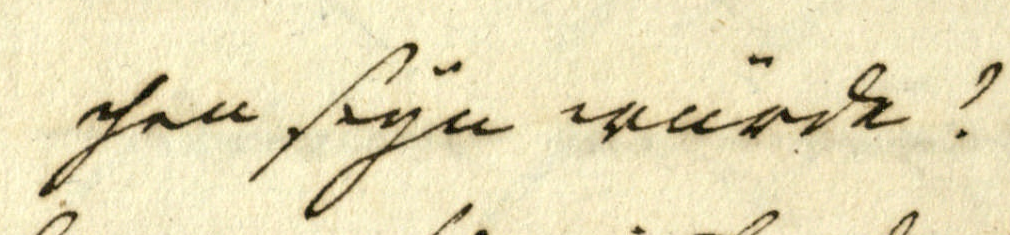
chen seÿn würde?
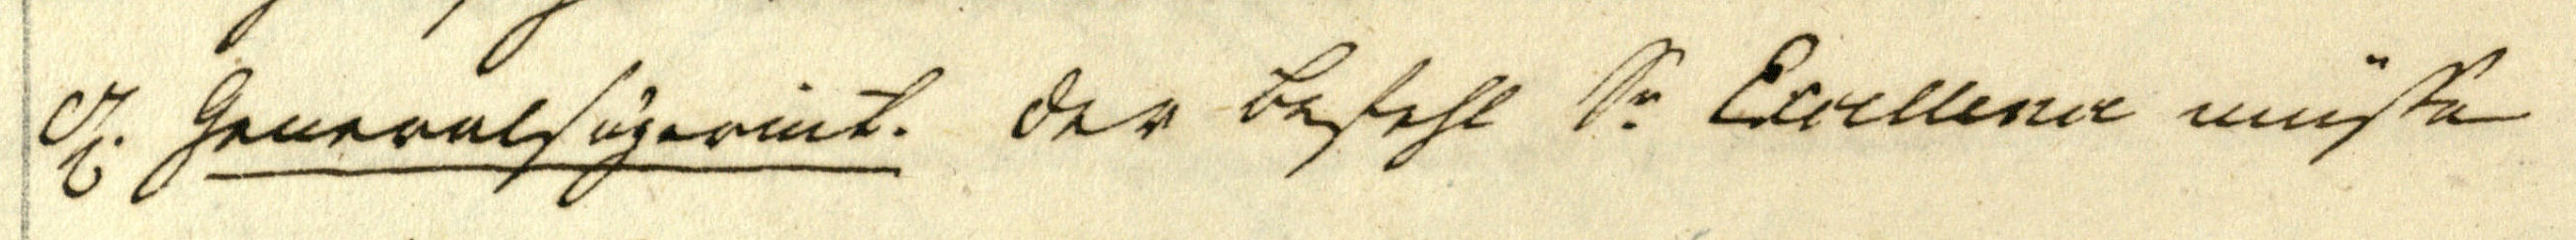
dh. Generalsuperint. der Befehl Sr Excellence müsse
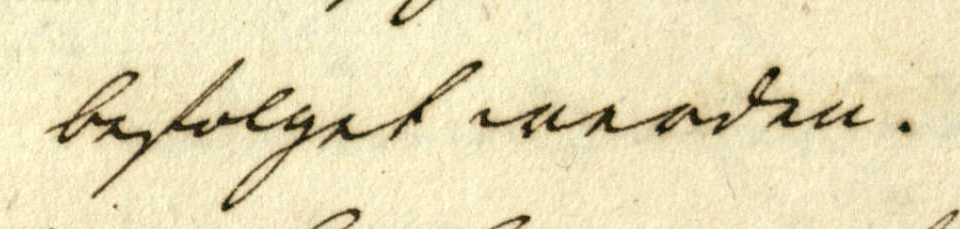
befolget werden.
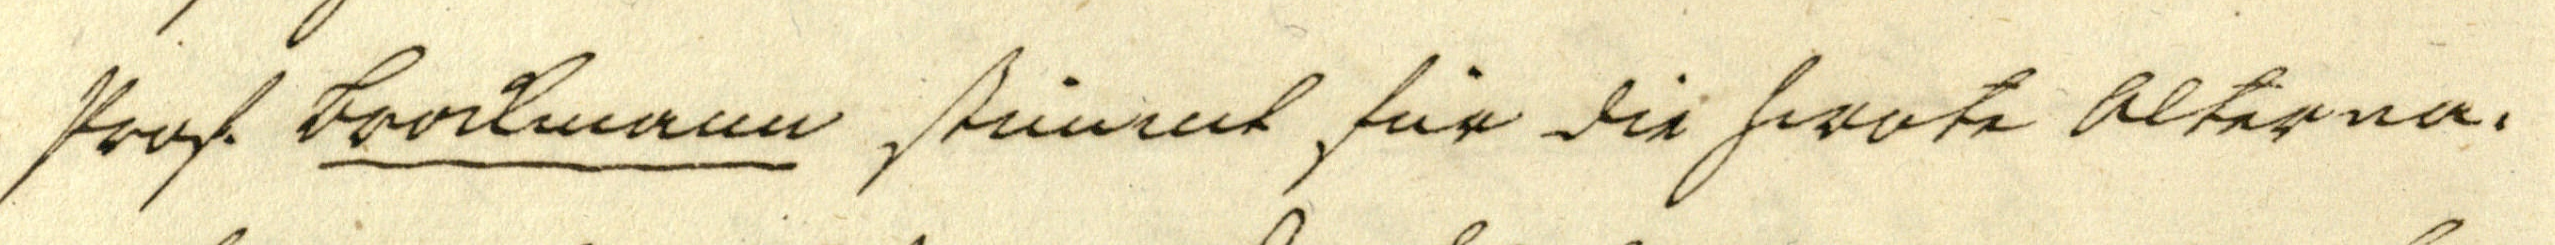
Prof. Brockmann stimmt für die zwote Alterna¬
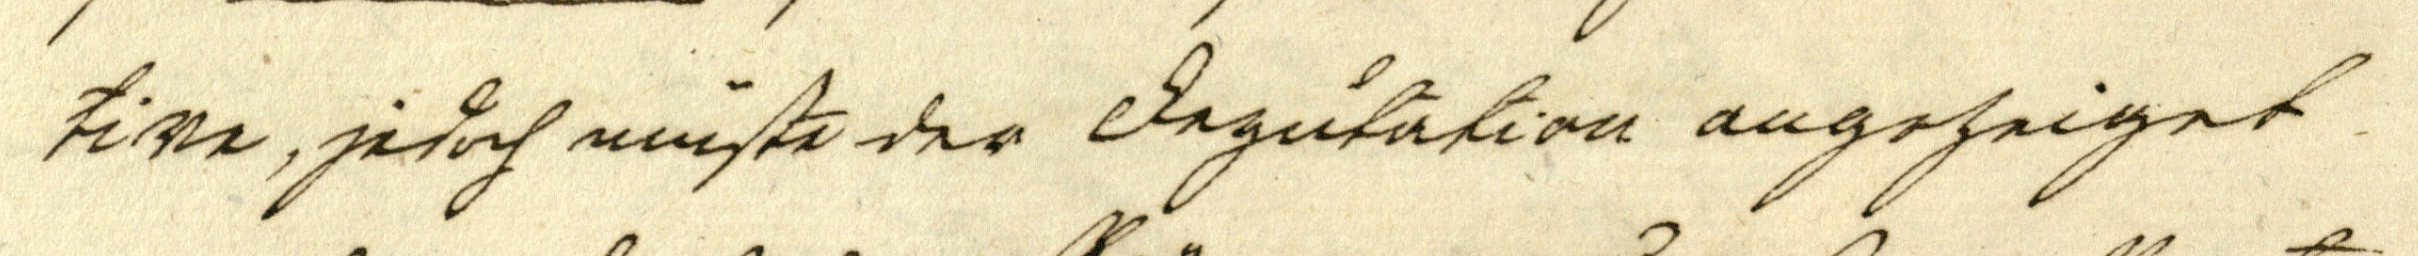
tive, jedoch müßte der Deputation angezeiget
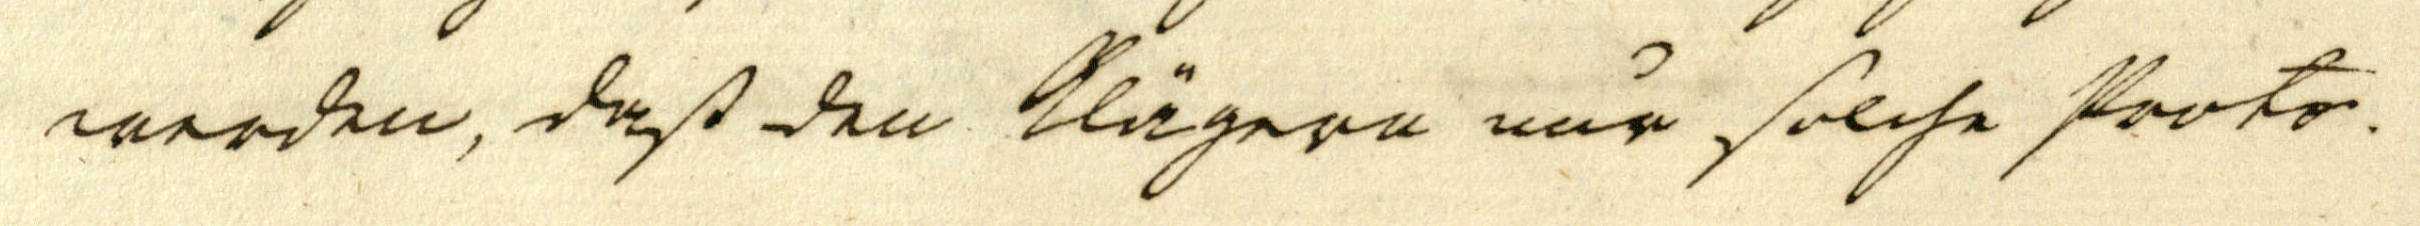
werden, daß den Klägern nur solche Proto¬
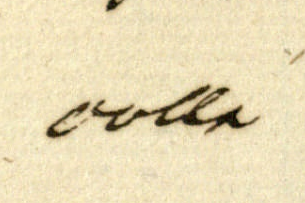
colle
